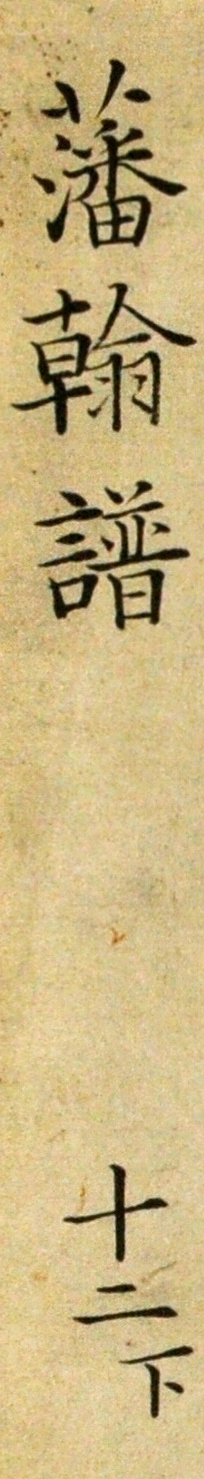藩翰譜十二下
